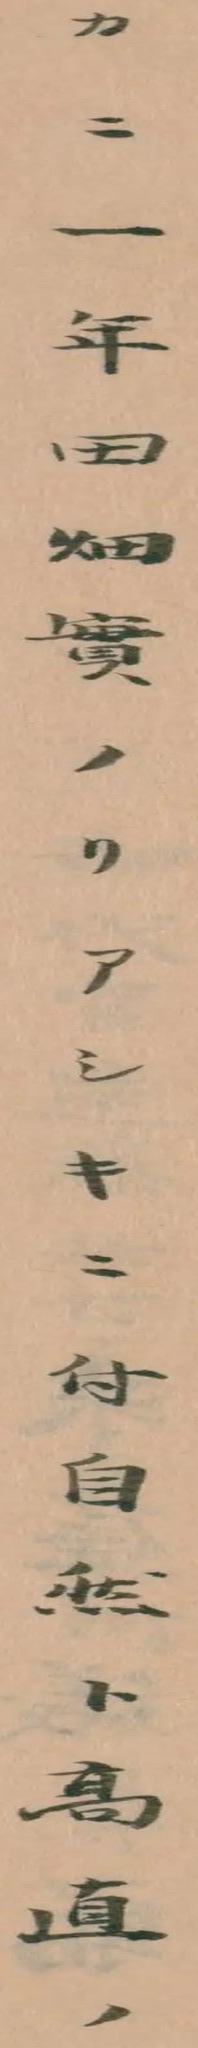カニ一年田畑実ノりアシキ二付自然ト高直ノ
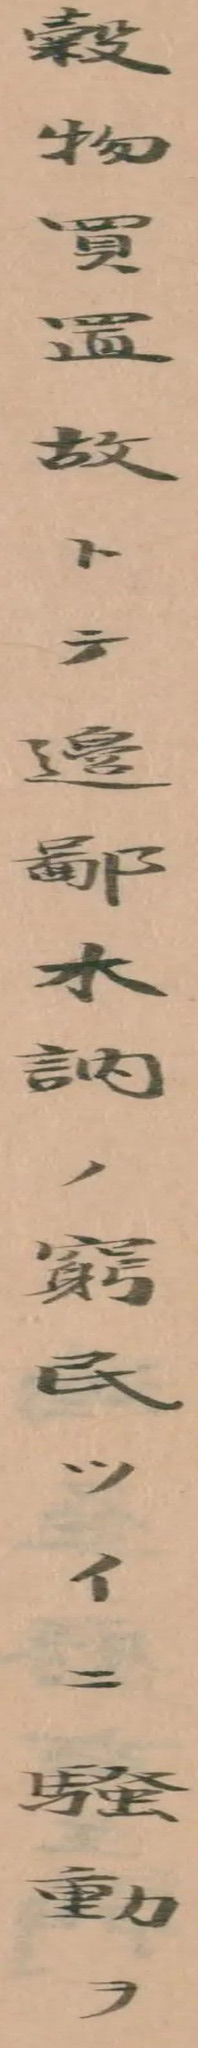穀物買置故トテ辺鄙木訥ノ窮民ツイニ騒動ヲ
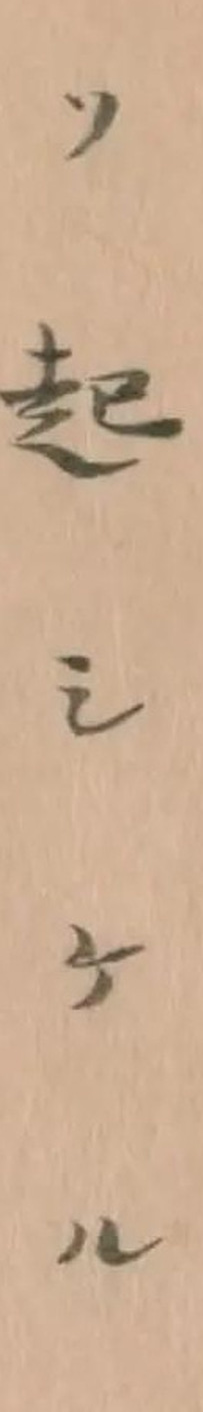ソ起シケル
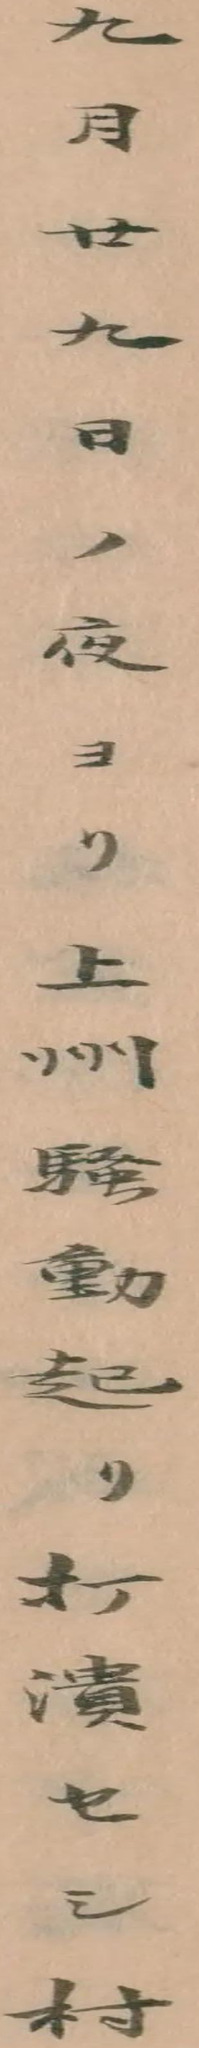九月廿九日ノ夜ヨリ上州騒動起り打潰セシ村
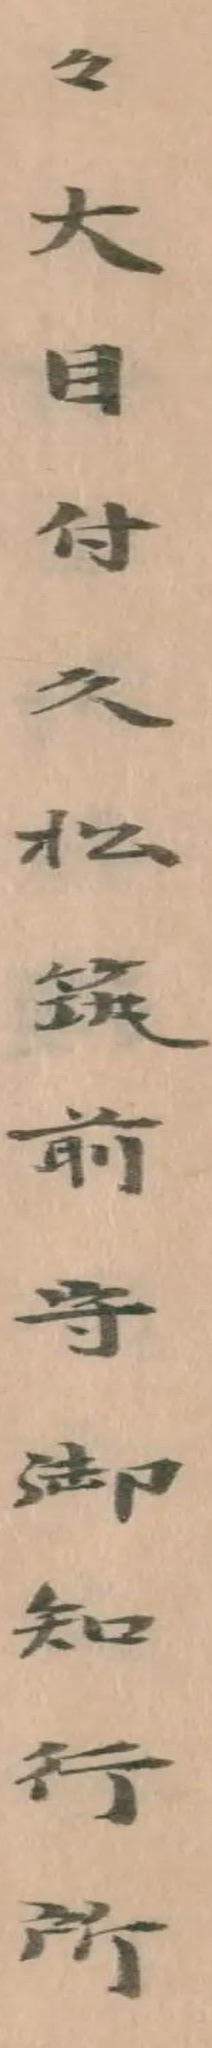々大目付久松筑前守御知行所
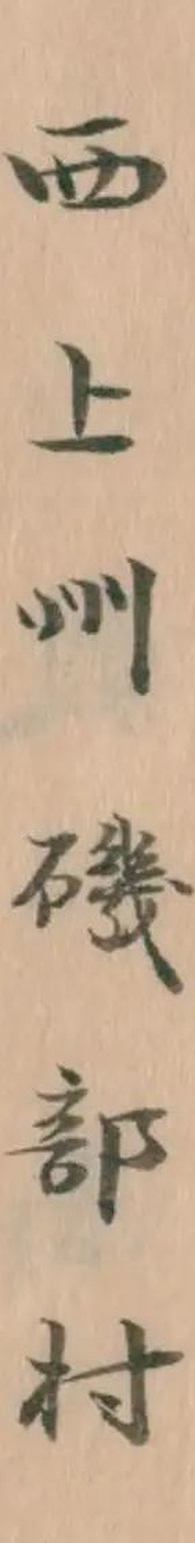西上州磯部村
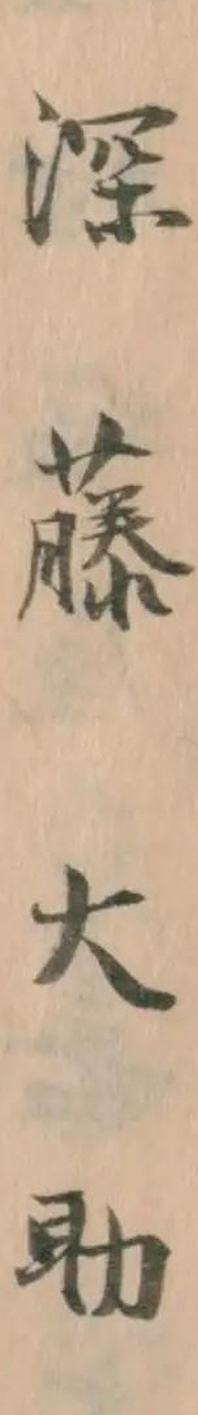深藤大助
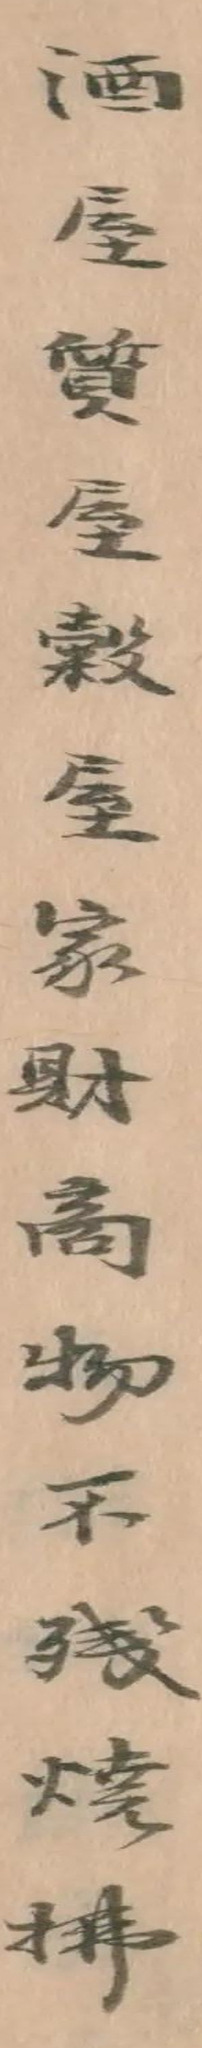酒屋質屋穀屋家財商物不残焼払
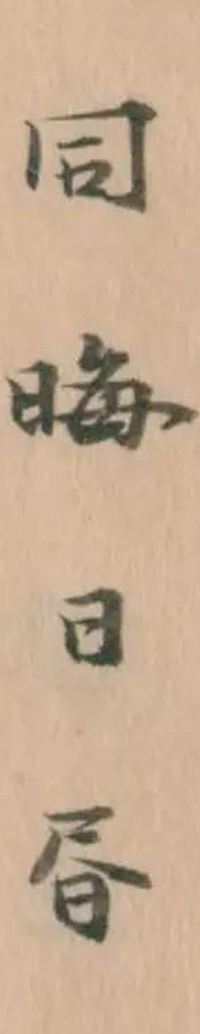同晦日昼

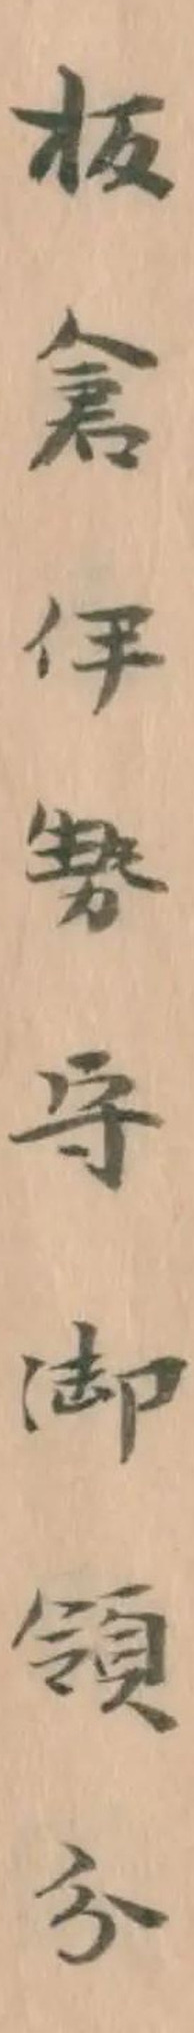板倉伊勢守御領分
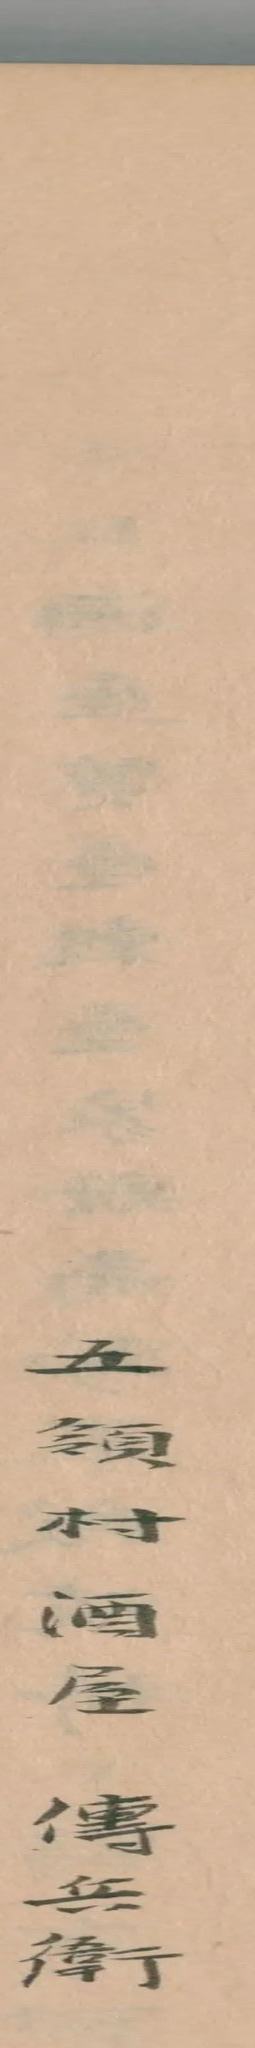五領村酒屋伝兵衛
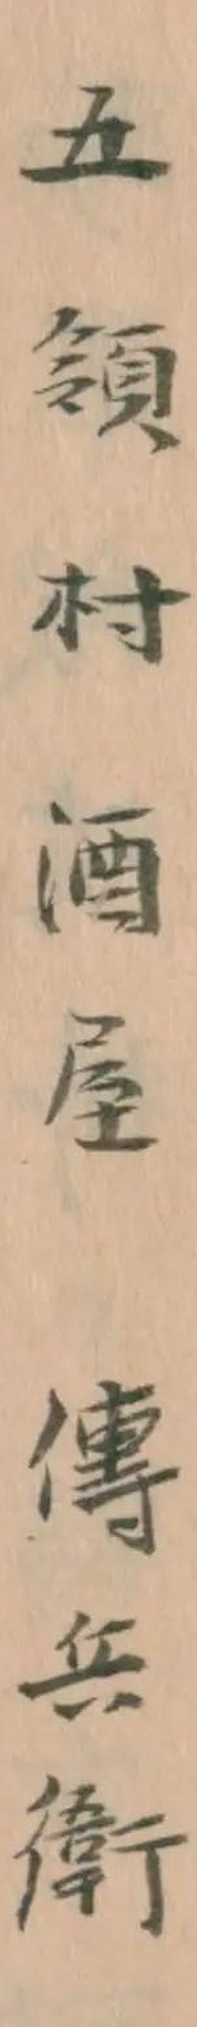五領村酒屋伝兵衛
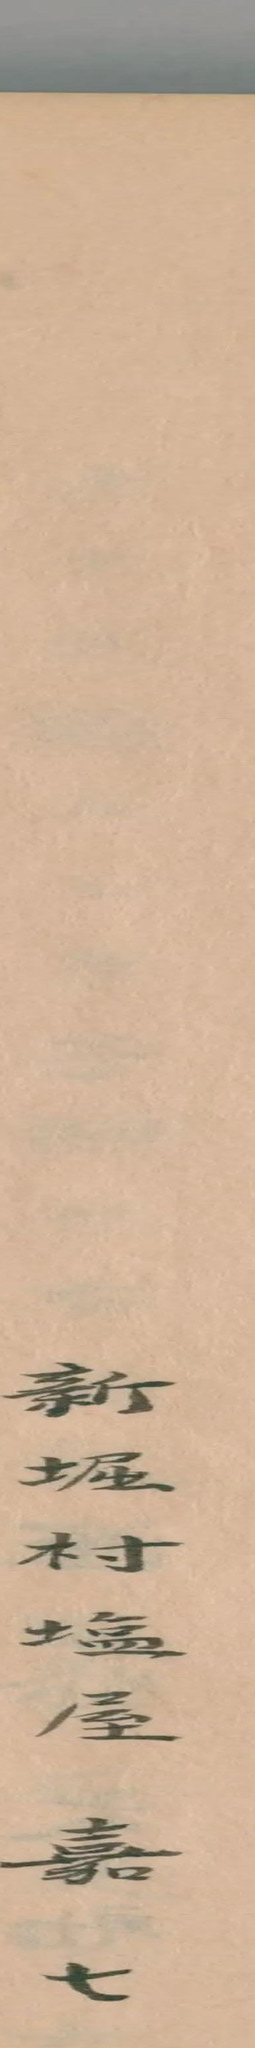新堀村塩屋嘉七
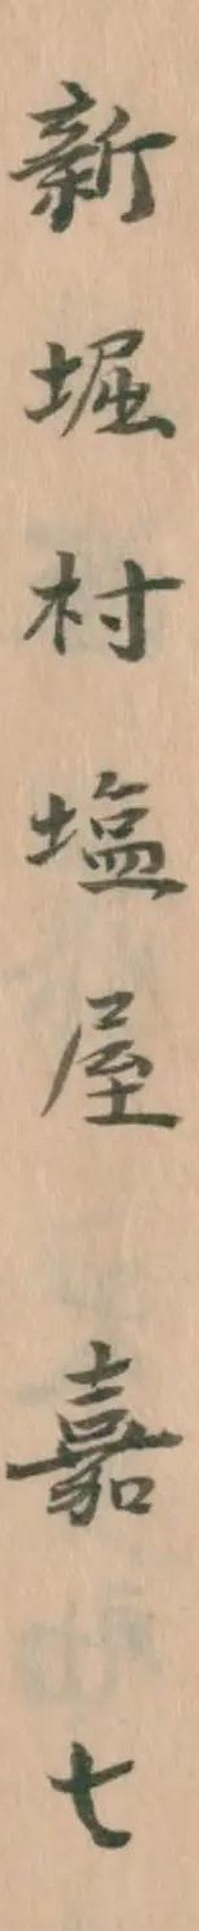新堀村塩屋嘉七
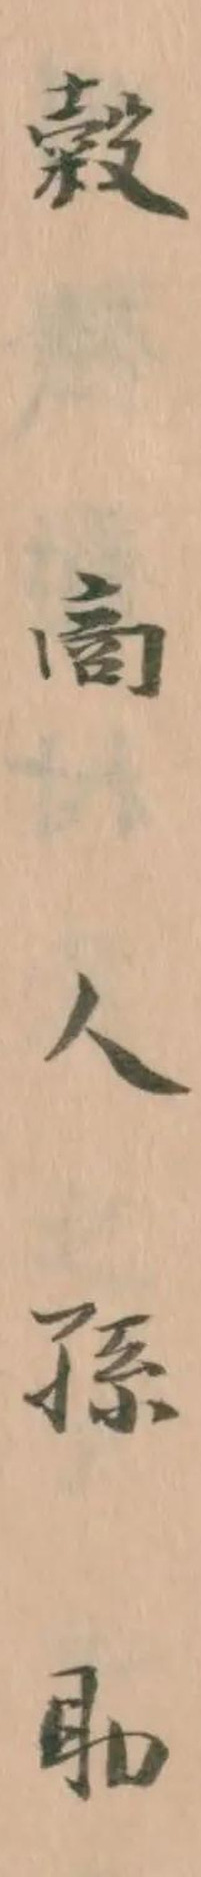穀商人孫助
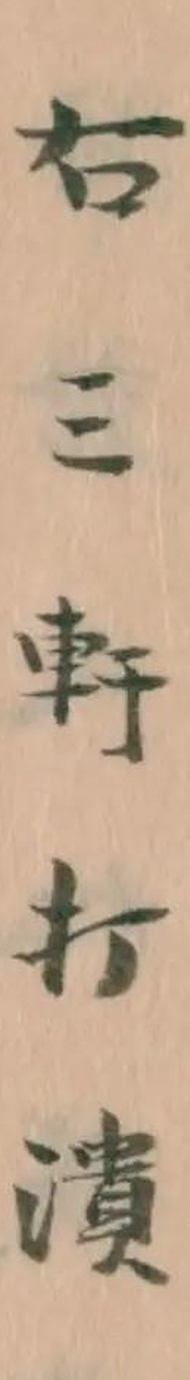右三軒打潰
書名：地災撮要. 巻3(地震之部)-巻4(噴火之部)
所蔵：国立国会図書館 National Diet Library, JAPAN
